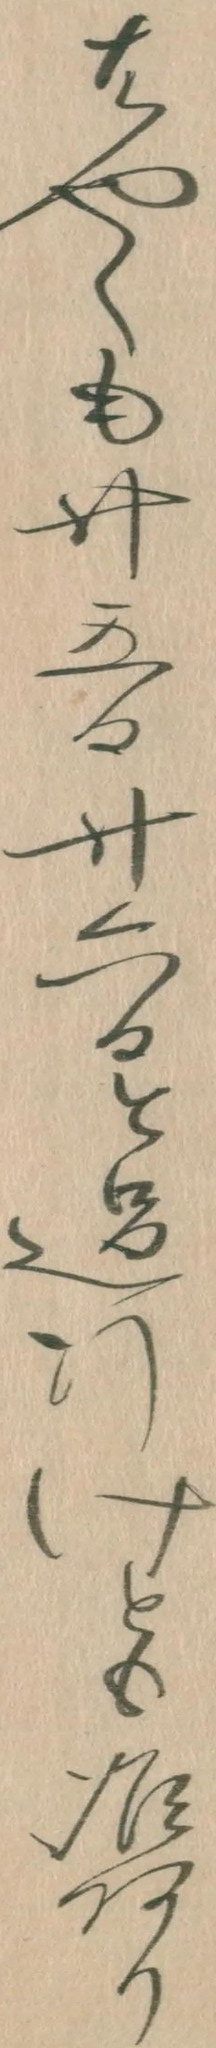はやくも廿五日廿六日と過行けとも准あり
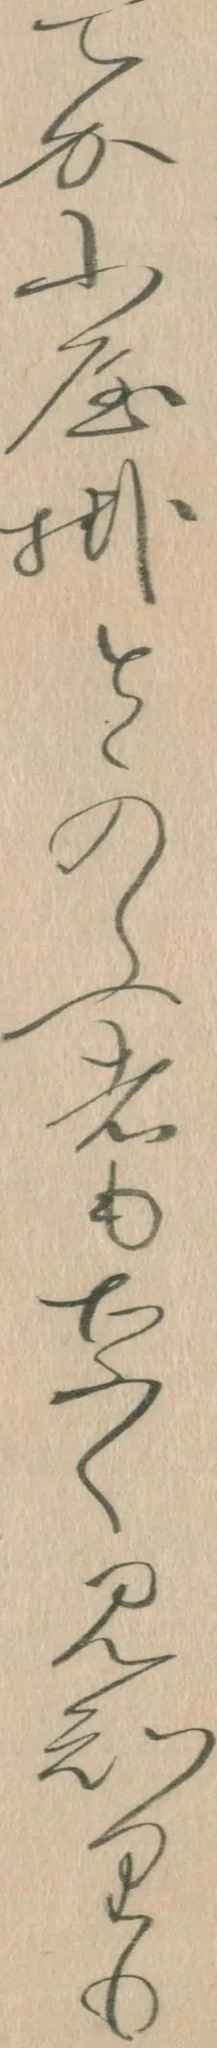てか小屋掛とてのふ者もなく見知りも
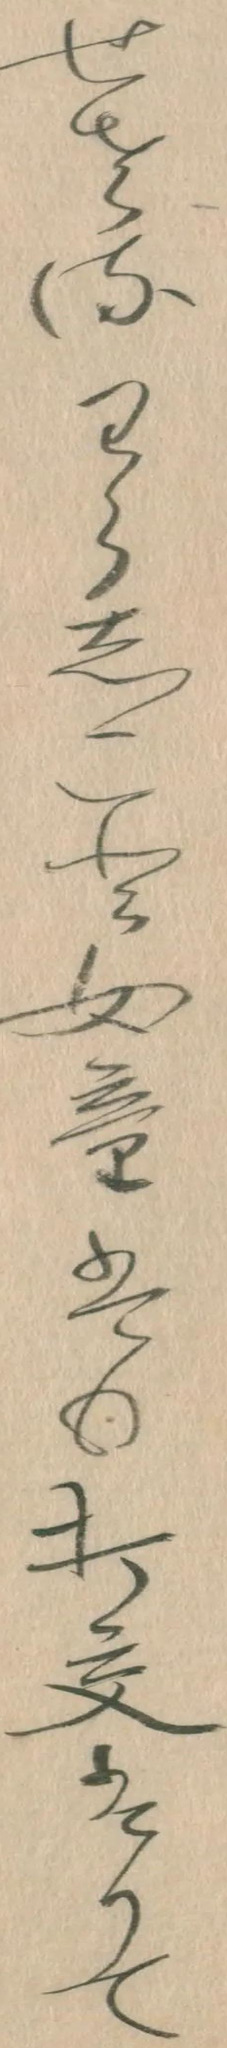せさるわらしこと女童はも打交はりて
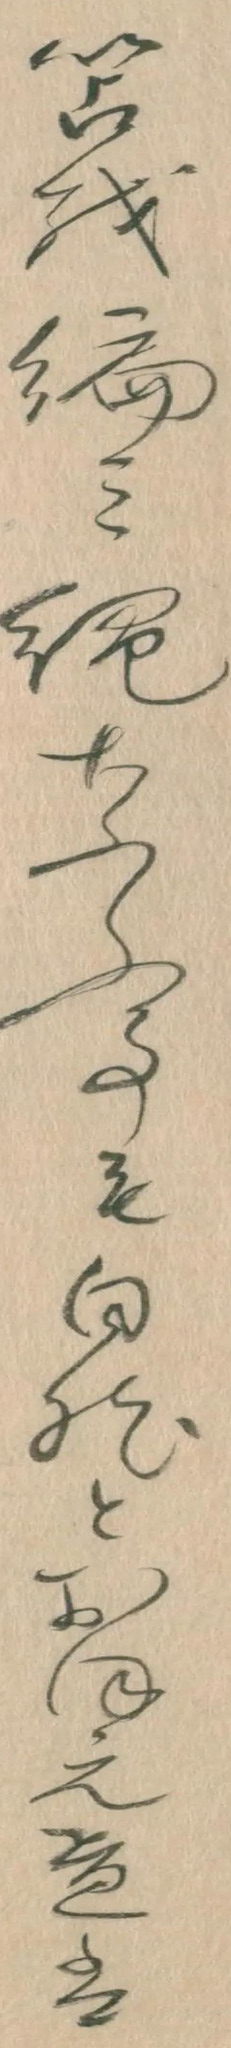笘を編み絶なふ事も自然とおほえ昼は
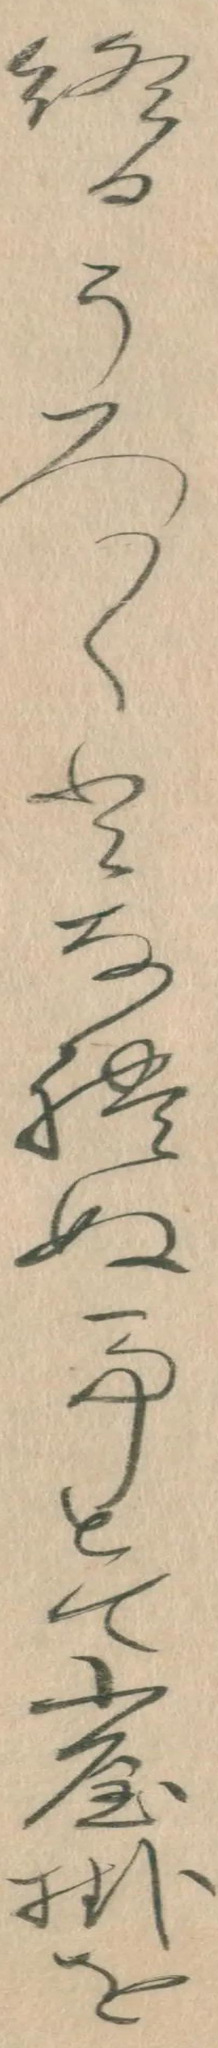終日うろ〳〵となれぬ事とて小屋掛を
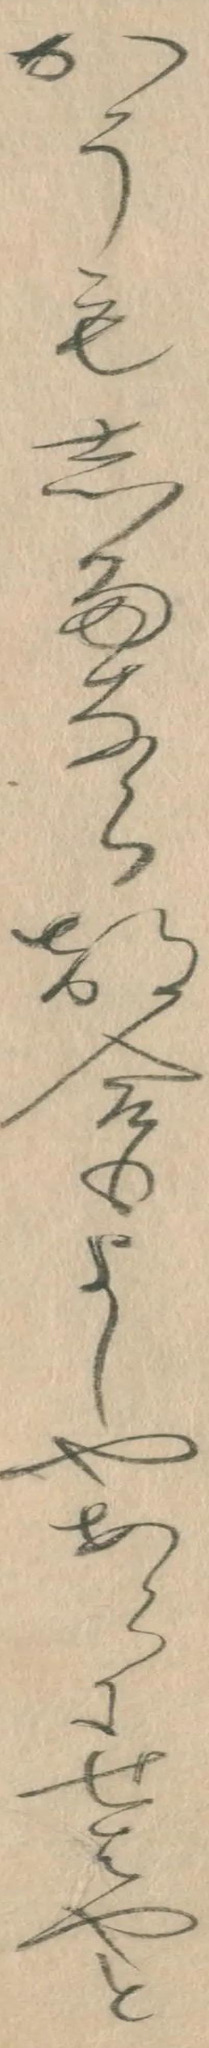かうもしたなら都合もよしやあらにせはやと

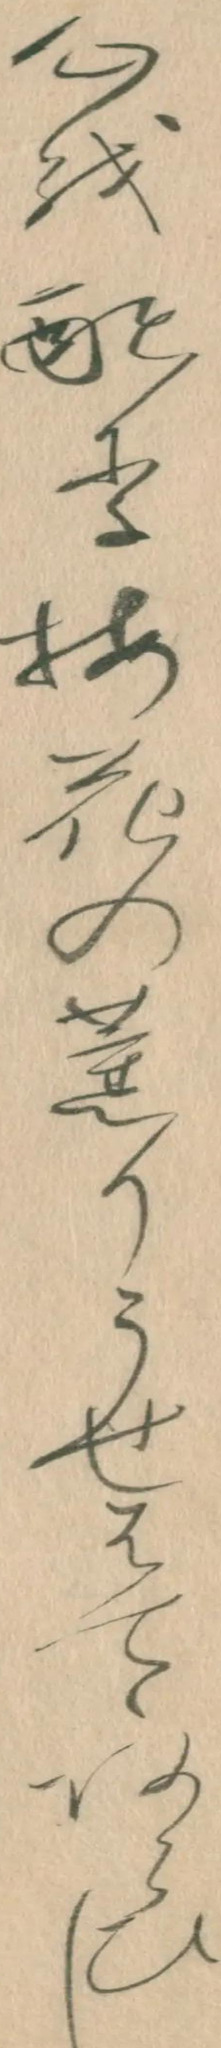心を配り梅花の薫りうせはてゝあらひし
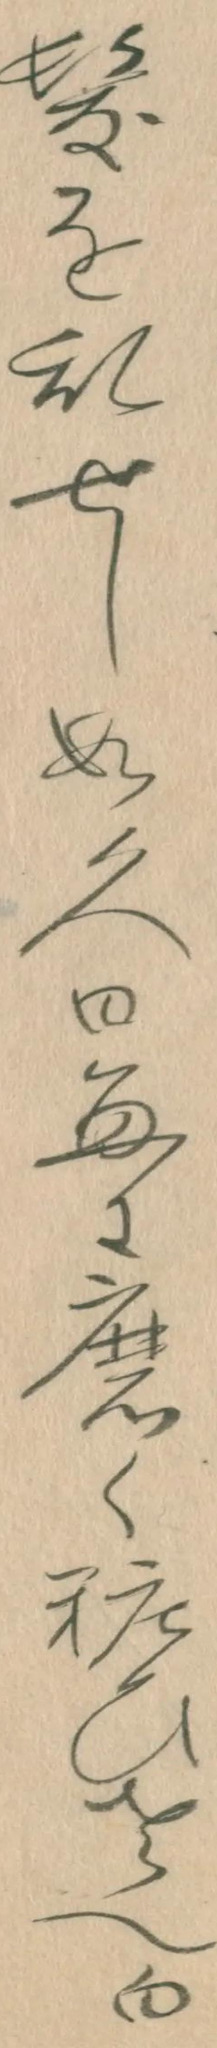髪を乱せし如く日毎に磨く粧ひさへ白
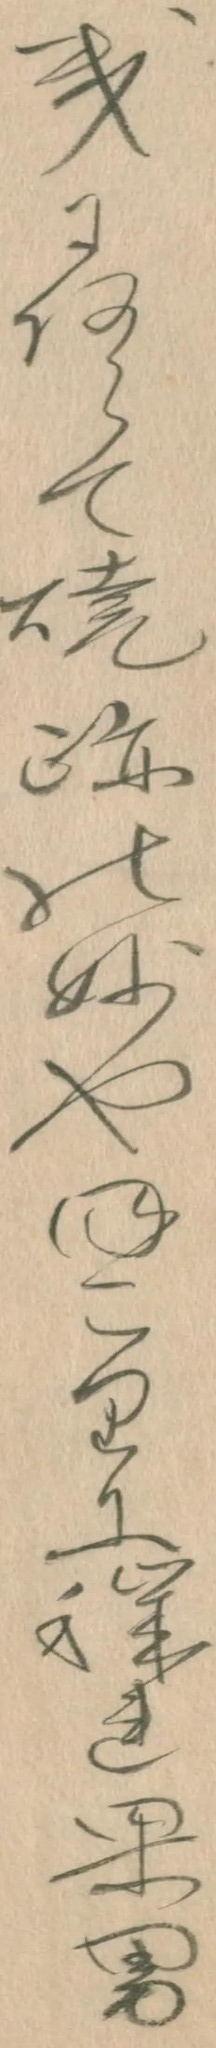きにあらて焼跡の妙やほこりに穢れ果男
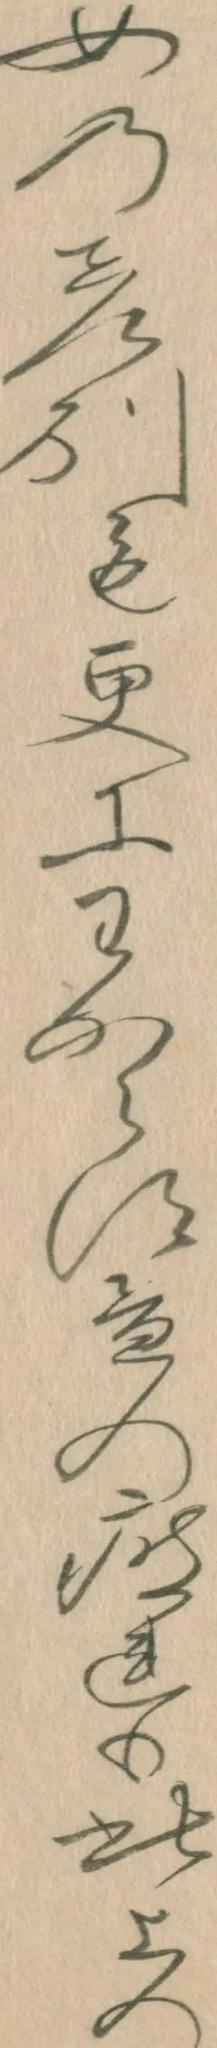女の差別も更にわからす昼の疲れも此上の
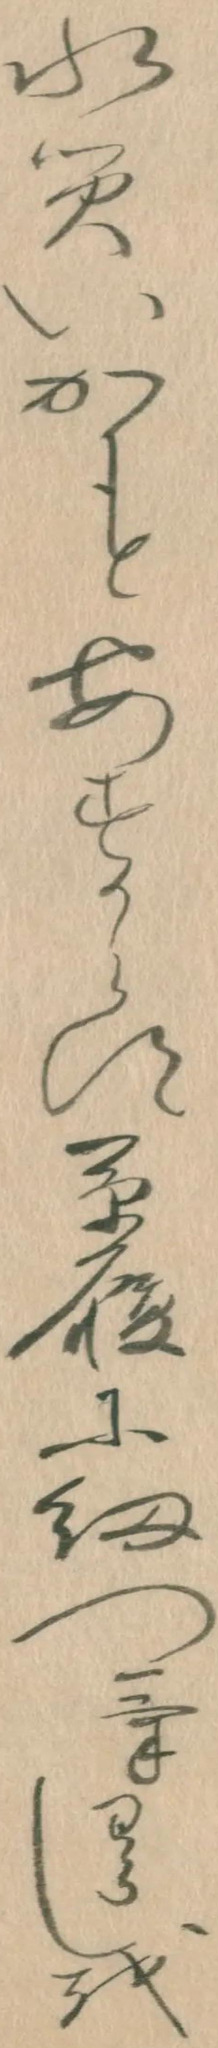水災いかよと安すからす草履に紐つけわらしを
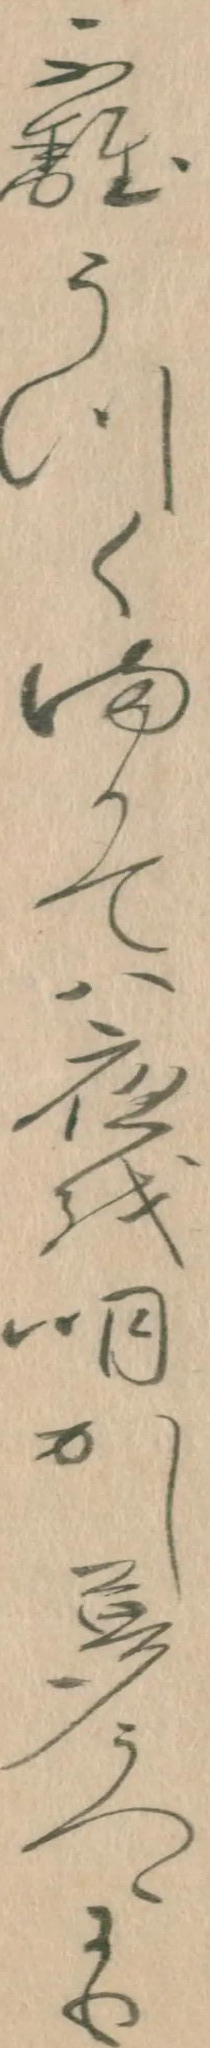不離うつくまりては夜を明かし夢うつゝにも
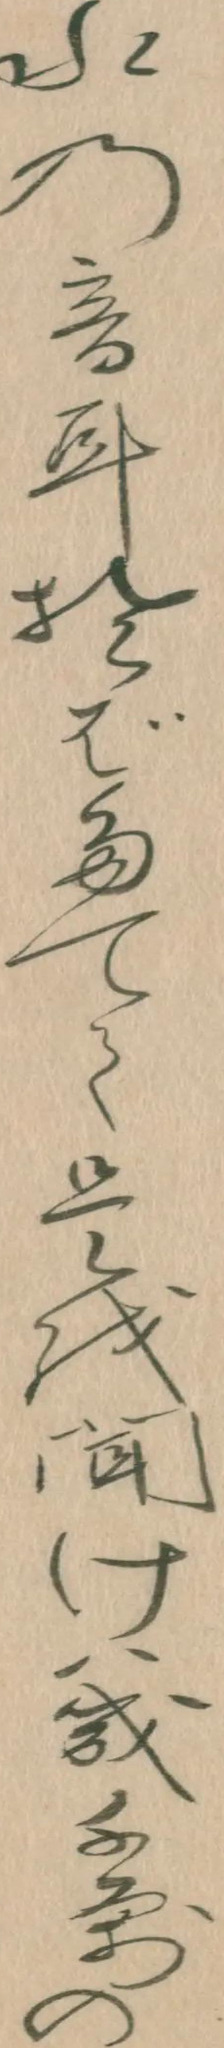水の音耳そばたてて是を聞けは幾千萬の
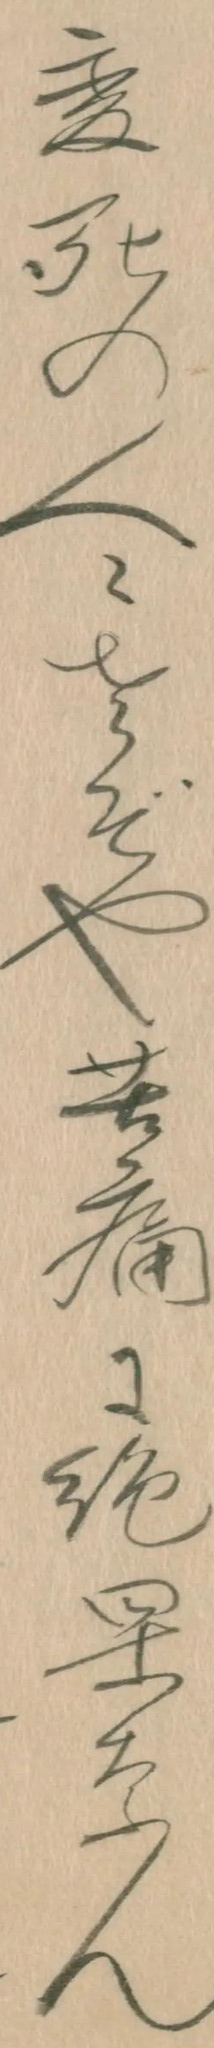変死の人々さぞや苦痛に絶果なん
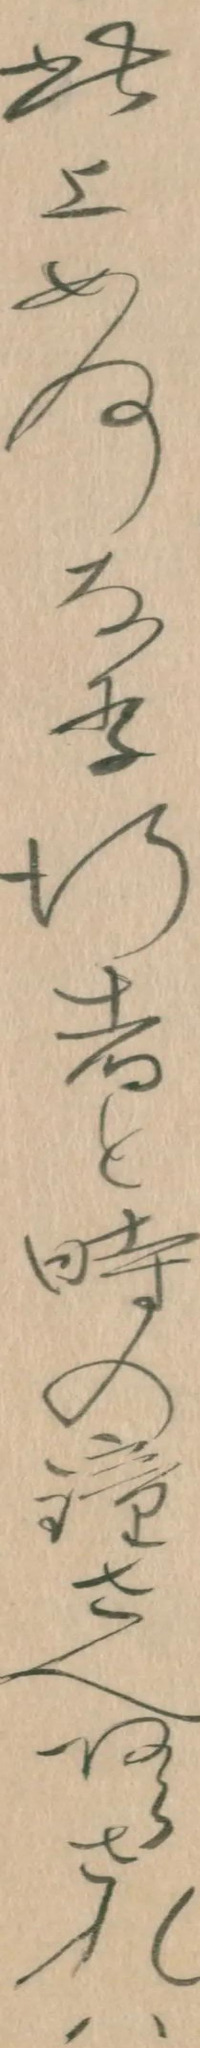此上如何なり行者と時の鐘さへあらされは
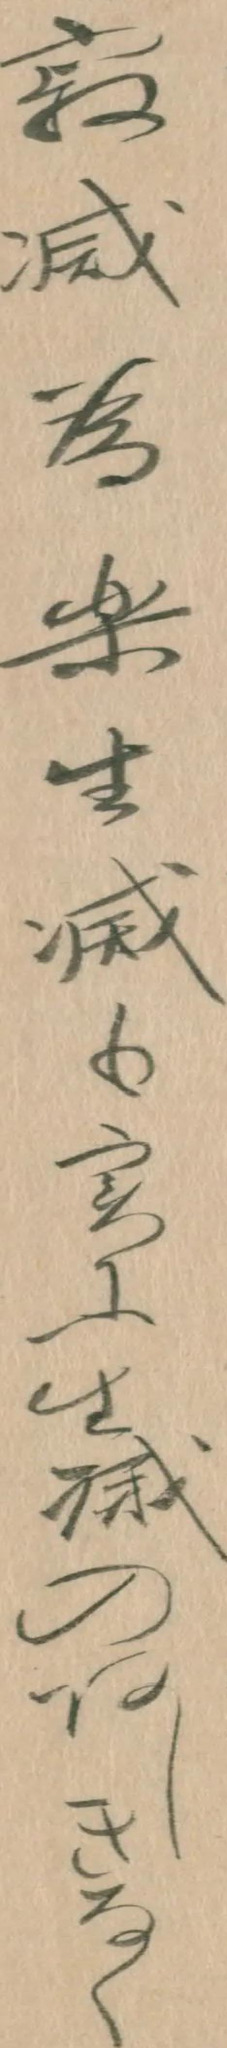寂滅為楽生滅も実に生滅のあしきなく
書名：俗語之種. [5]
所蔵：国立国会図書館 National Diet Library, JAPAN
